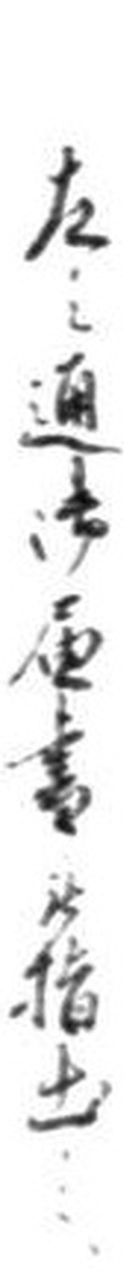左之通御届書被指出之
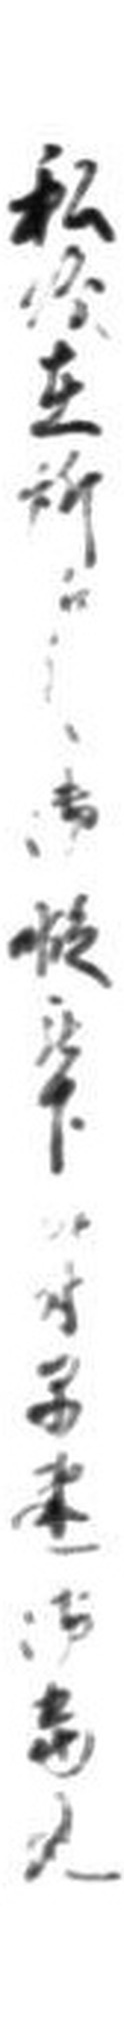私儀在所江之御暇被下候付早速御当地
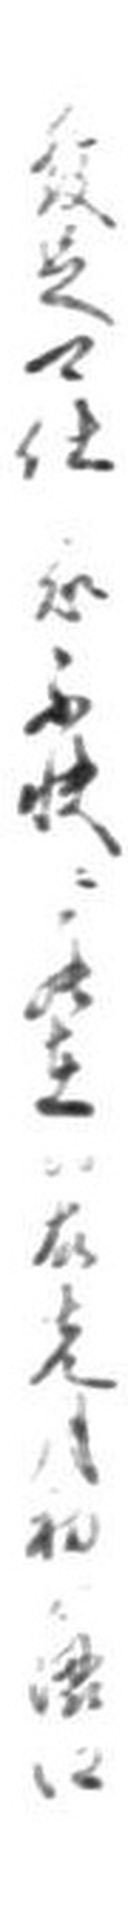発足可仕候処不快ニ罷在候故先月初ニ渋江
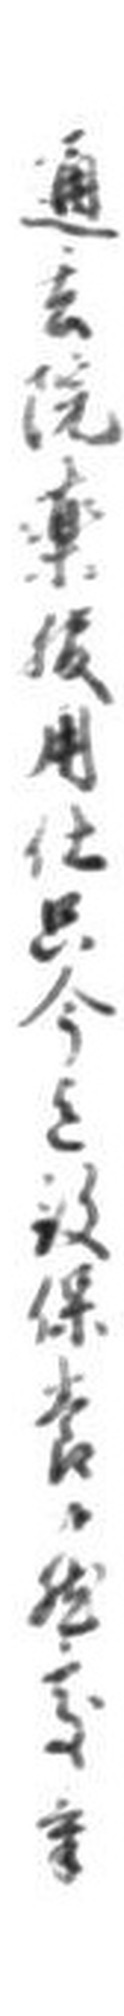通玄院薬服用仕只今迄致保養候然処気
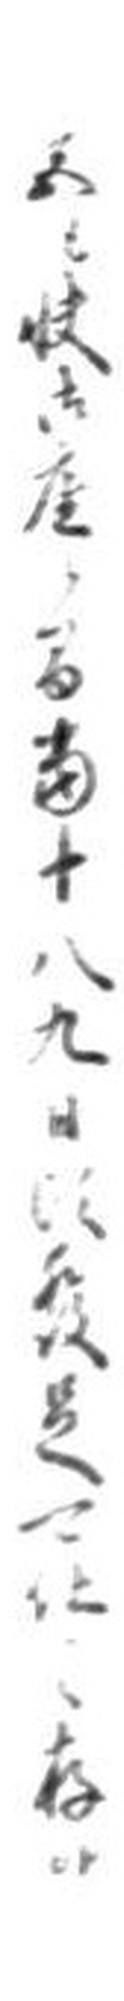色も快御座候間当十八九日頃発足可仕与存候
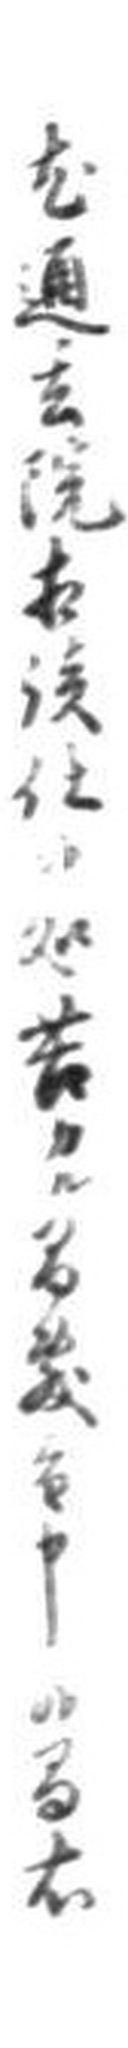尤通玄院相談仕候処苦カル間敷旨申候間右
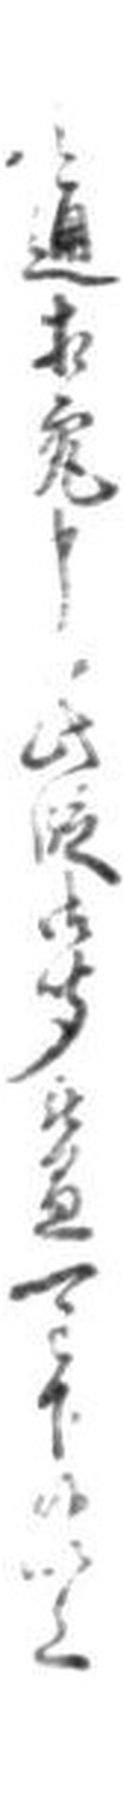之通相究申候此段御聞被置可被下候以上

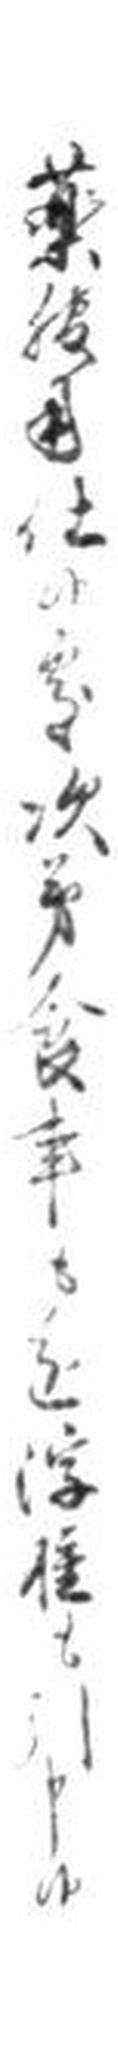薬服用仕候処次第食事も進浮腫も引申候
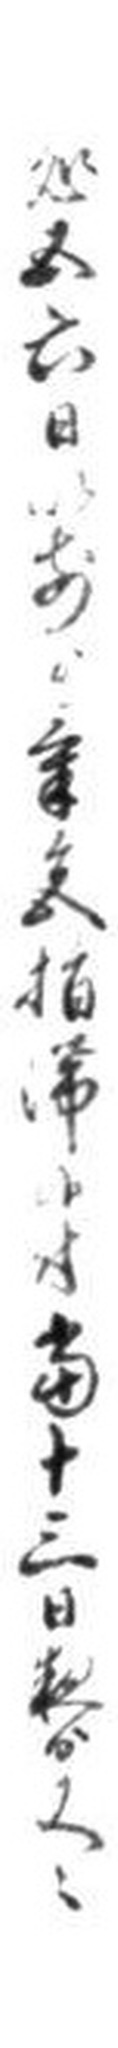処五六日以前ゟ気色指滞候付当十三日夜ゟ又々
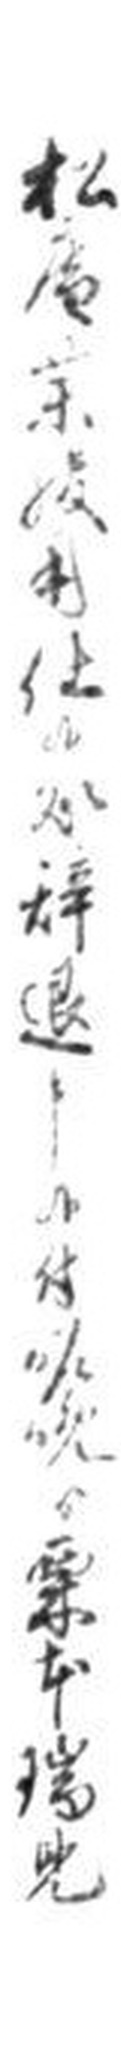松庵薬服用仕候処辞退申候付昨晩ゟ栗本瑞見
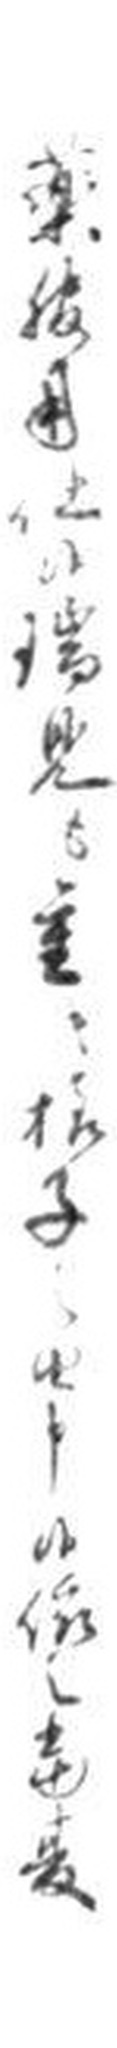薬服用仕候瑞見も重キ様子之由申候依之当夏
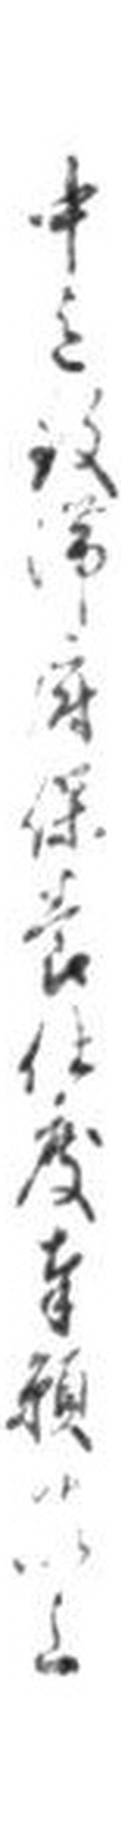中迄致滞府保養仕度奉願候以上
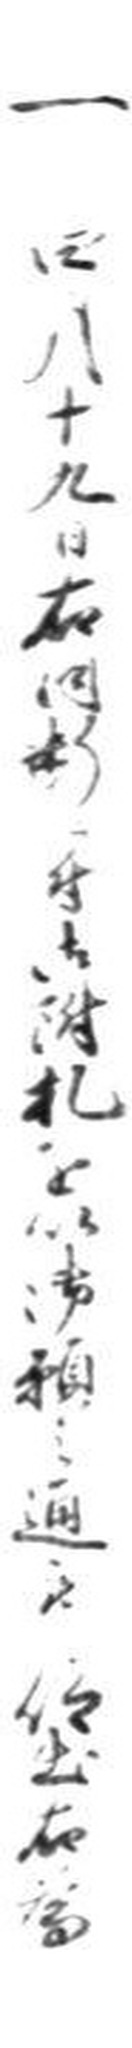一四月十九日右同断ニ付御付札を以御願之通被仰出右為
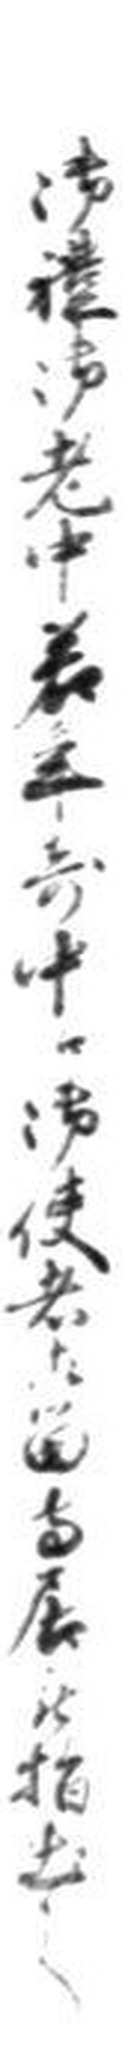御礼御老中若年寄中江御使者御留守居被指出之
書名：家譜 三十六 宗昌公 従享保八年到同九年
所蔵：福井県文書館 Fukui Prefectural Archives
